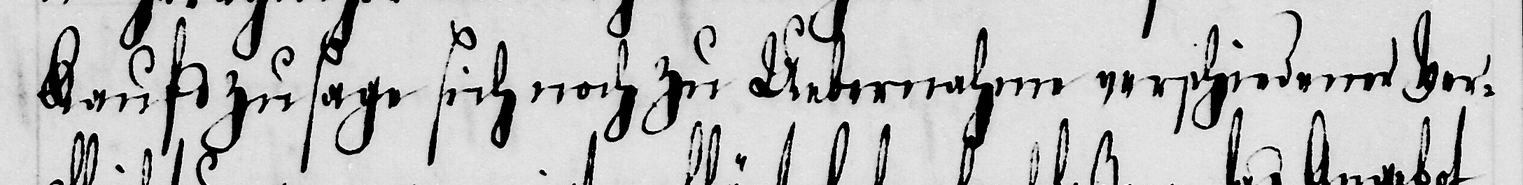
Kaufszusage sich noch zu Uebernahme verschiedener Ver¬
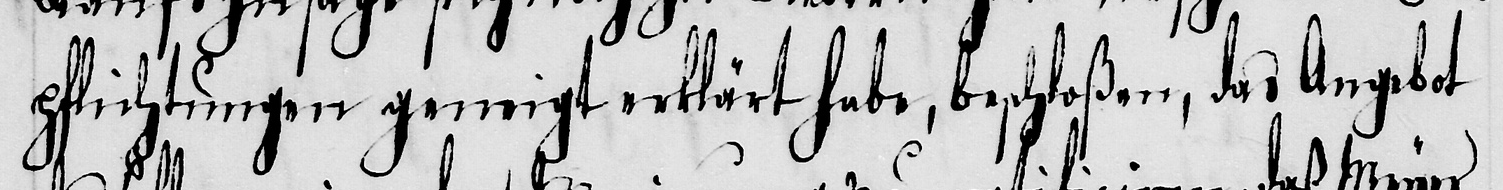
pflichtungen geneigt erklärt habe, beschloßen, das Angebot
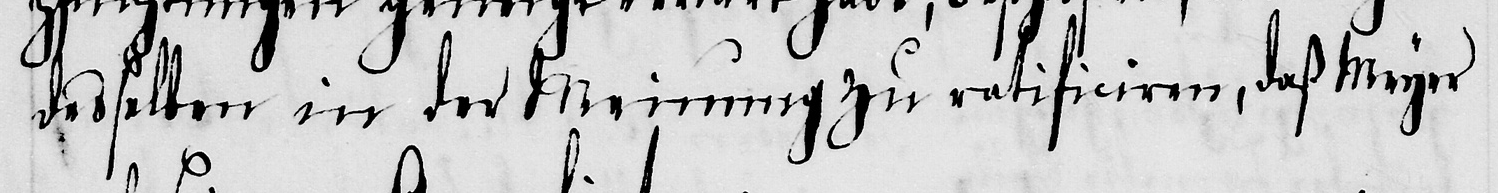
desselben in der Meinung zu ratificiren, daß Meyer
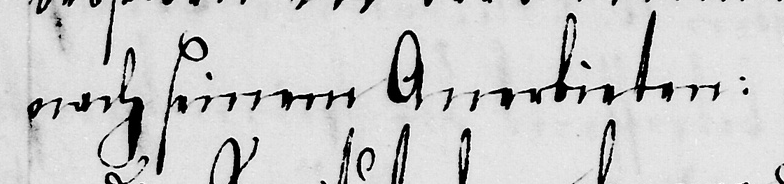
nach seinem Anerbieten:
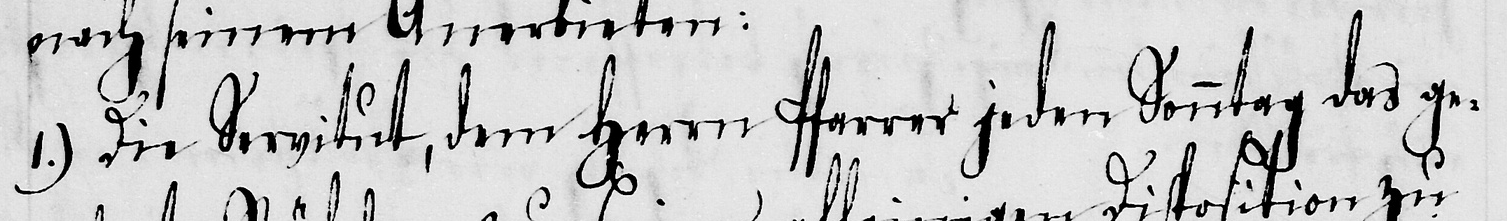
1.) Die Servitut, dem Herrn Pfarrer jeden Sonntag das ge¬
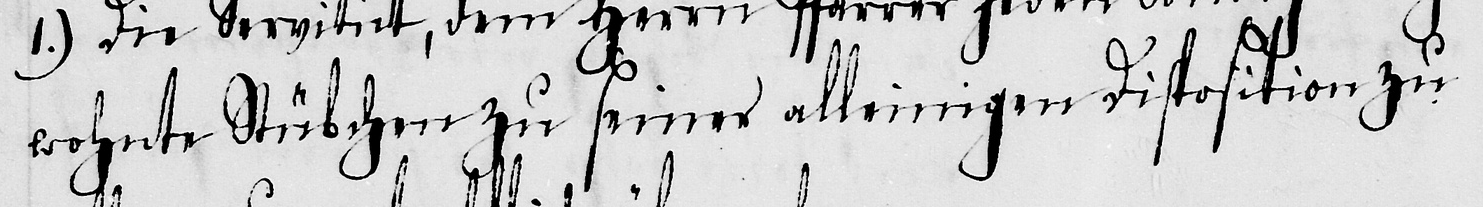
wohnte Stübchen zu seiner alleinigen Disposition zu
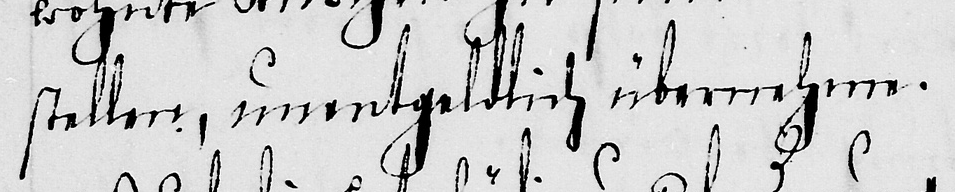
stellen, unentgeltlich übernehme.
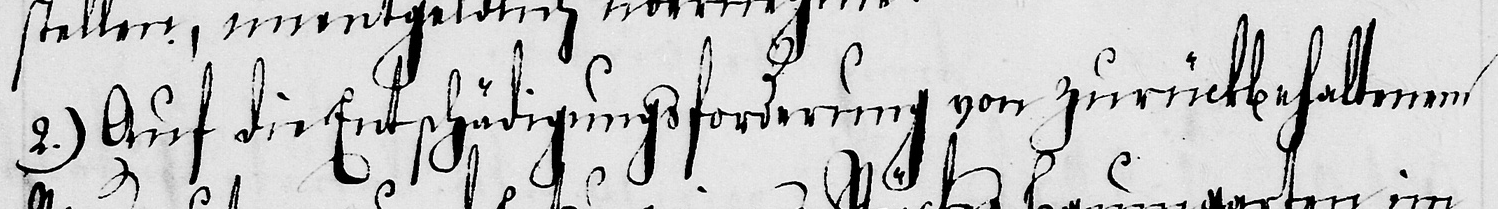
2.) Auf die Entschädigungsforderung von zurückbehaltenem
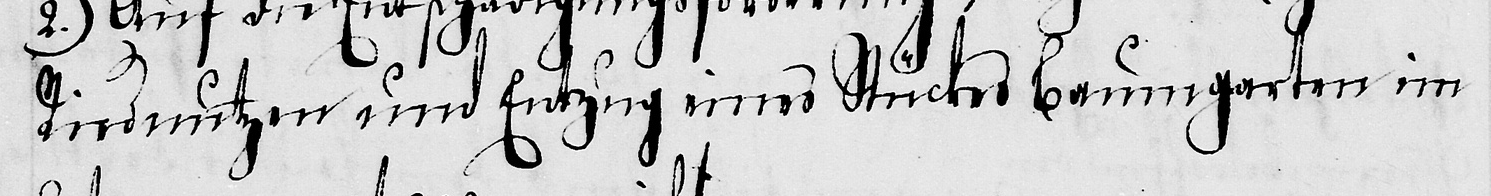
Riednutzen und Entzug eines Stückes Baumgarten im
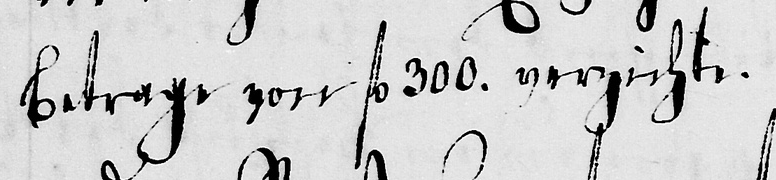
Betrage von fl. 300. verzichte.
